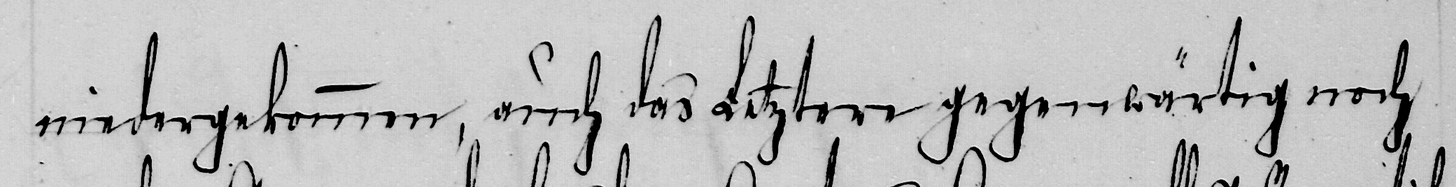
niedergekommen, auch das Letztere gegenwärtig noch
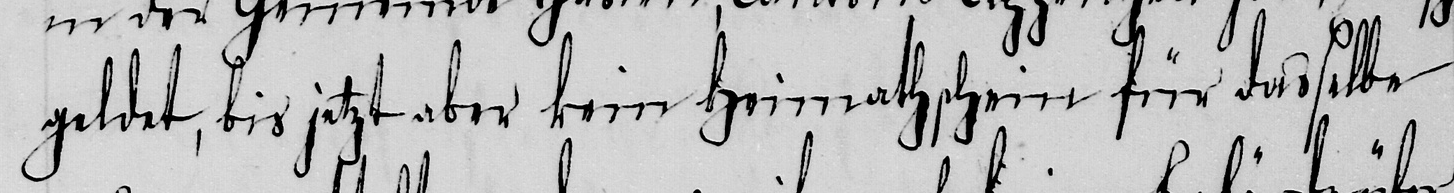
geldet, bis jetzt aber kein Heimathschein für dasselbe
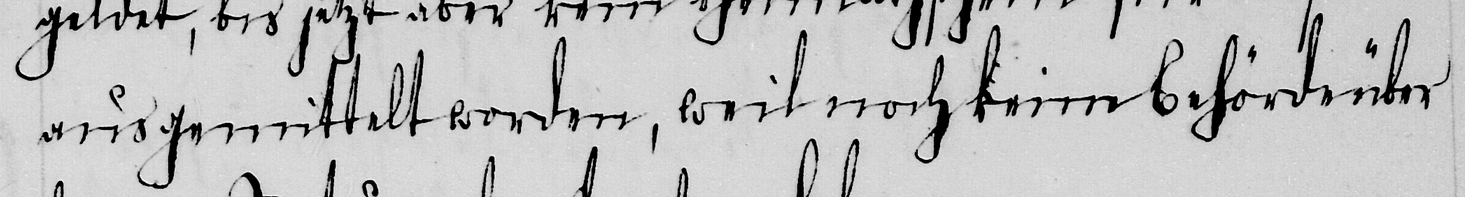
ausgemittelt worden, weil noch keine Behörde über
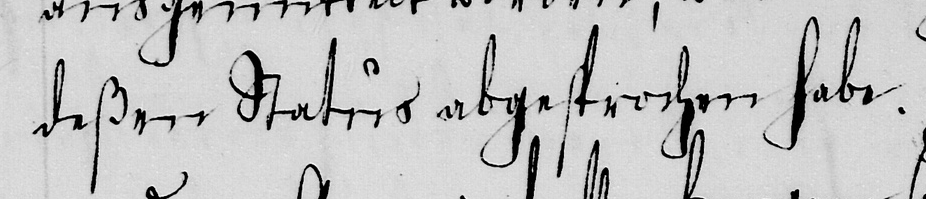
deßen Status abgesprochen habe.
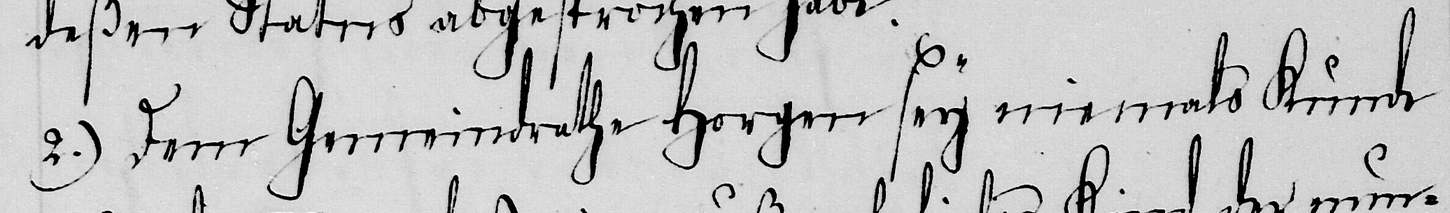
2.) Dem Gemeindrathe Horgen sey niemals Kunde
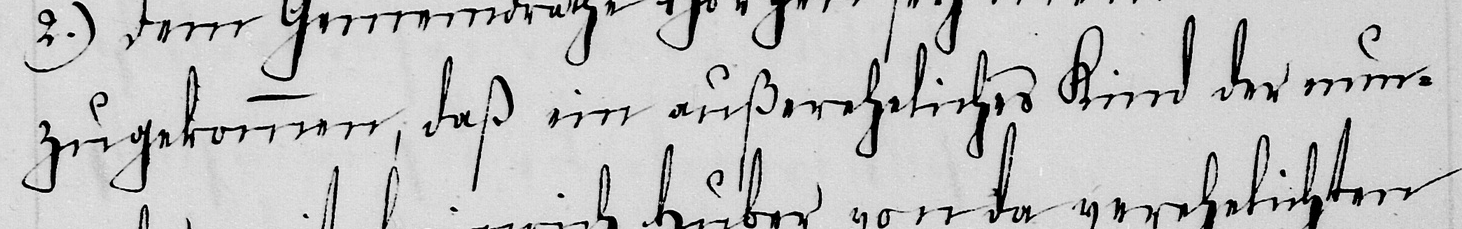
zugekommen, daß ein außereheliches Kind der nun¬
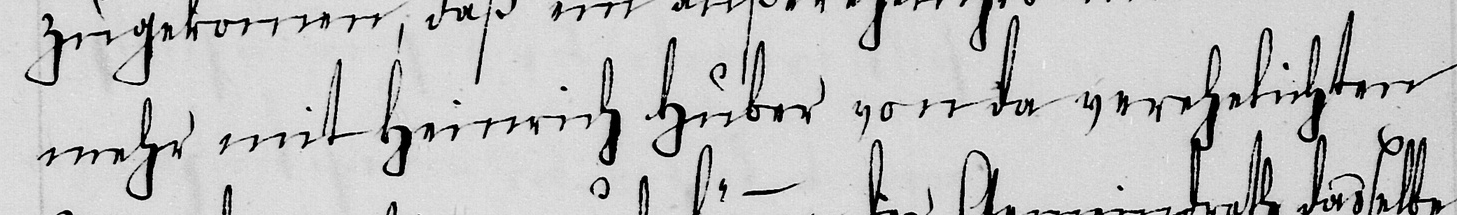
mehr mit Heinrich Huber von da verehelichten
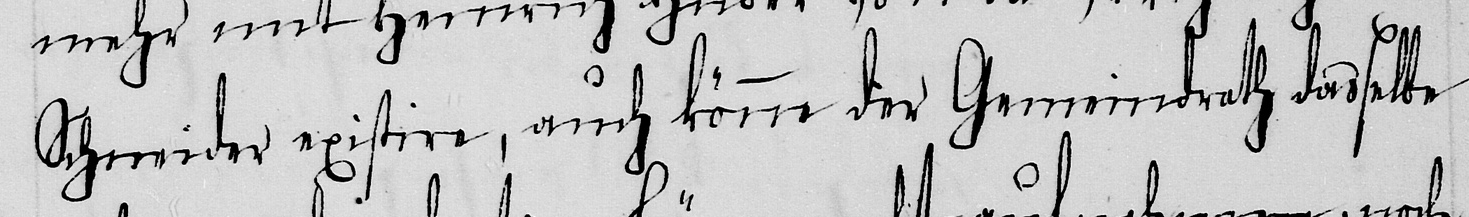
Schneider existire, auch könne der Gemeindrath dasselbe
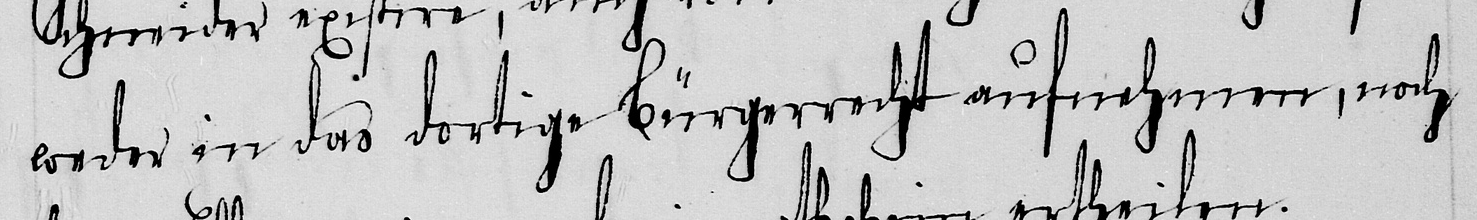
weder in das dortige Bürgerrecht aufnehmen, noch
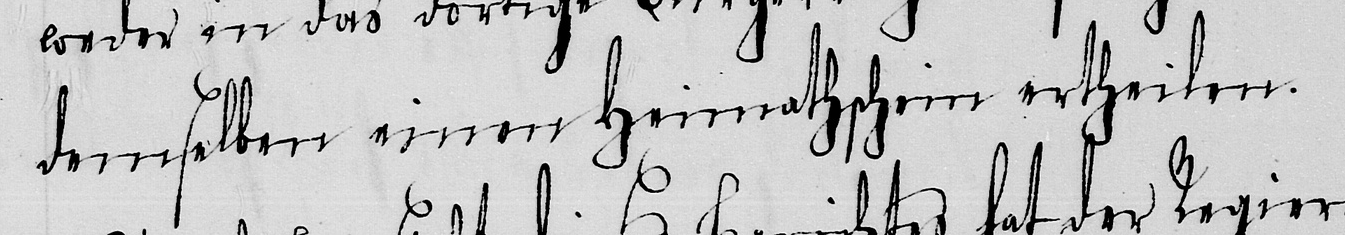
demselben einen Heimathschein ertheilen.
